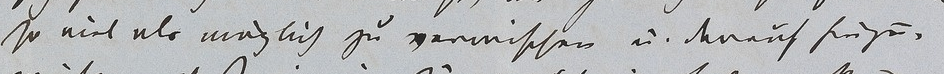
so viel als möglich zu verwischen u. darauf hinzu-
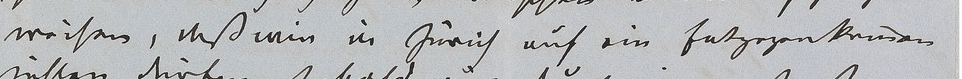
weisen, daß wir in Zürich auf ein Entgegenkommen
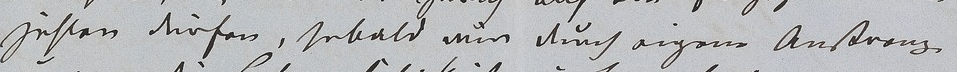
zählen dürfen, sobald wir durch eigene Anstreng-
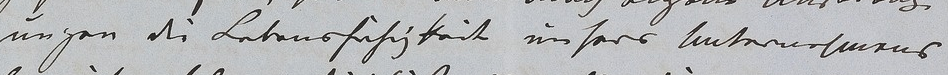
ungen die Lebensfähigkeit unsers Unternehmens
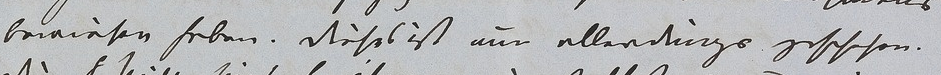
bewiesen haben. Dieses ist nun allerdings geschehen.
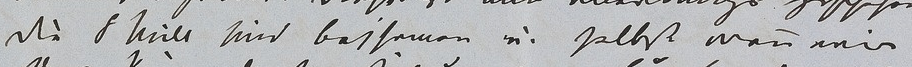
Die 8 Mill sind beisamen u. selbst wenn wir
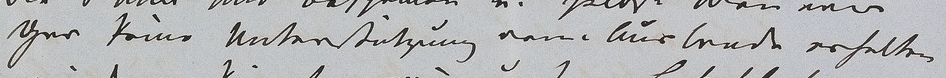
gar keine Unterstützung vom Auslande erhalten
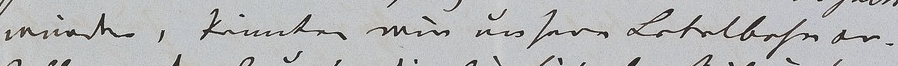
würden, könnten wir unsere Lokalbahn er-
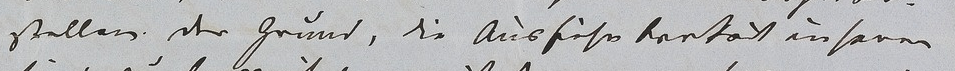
stellen. Der Grund, die Ausführbarkeit unserer
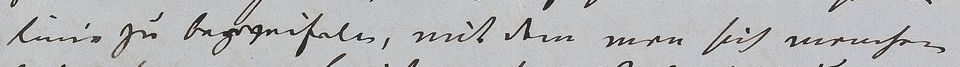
Linie zu bezweifeln, mit dem man sich mancher
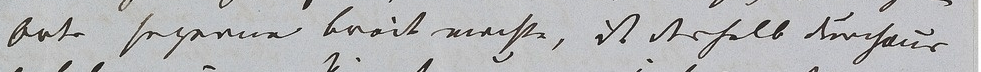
Orts so gerne breit machte, ist deshalb durchaus
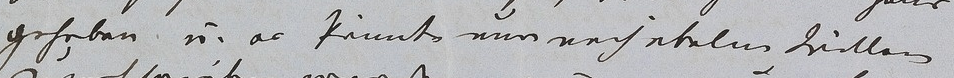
gehoben u. es könnte nur noch übelm Willen
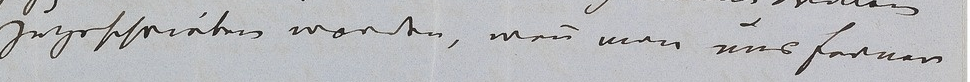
zugeschrieben werden, wenn man uns ferner
